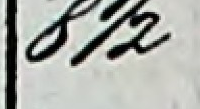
8 1/2
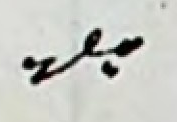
Do
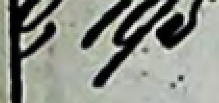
0,195
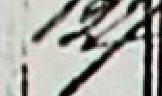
127
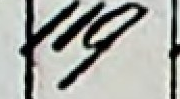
119
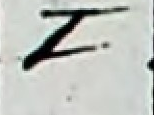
I
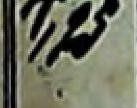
4,25
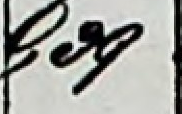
0,39
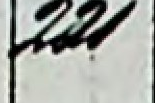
221
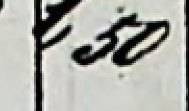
1,50
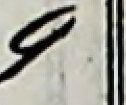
9
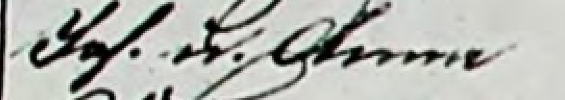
Joh. u. Anna
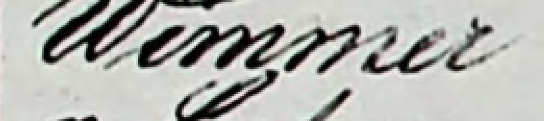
Wimmer
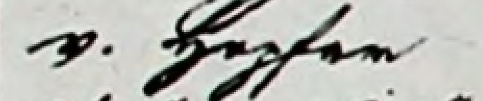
v. Hepfer
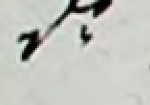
Do
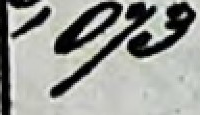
0,073
